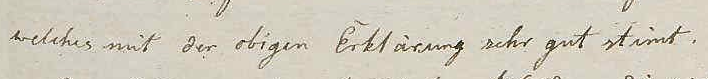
welches mit der obigen Erklärung sehr gut stimt.
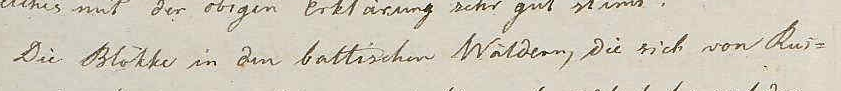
Die Blökke in den baltischen Wäldern, die sich von Rus-
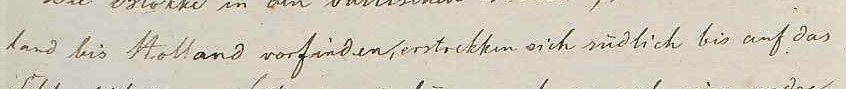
land bis Holland vorfinden, erstrekken sich südlich bis auf das
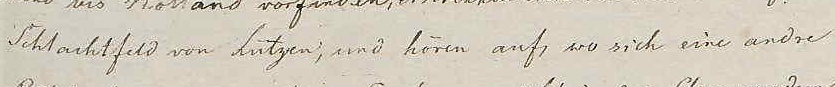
Schlachtfeld von Lützen, und hören auf, wo sich eine andre
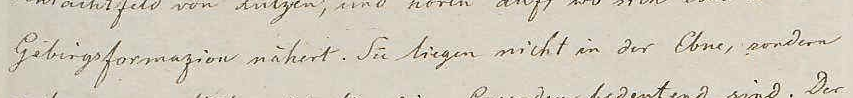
Gebirgsformazion nähert. Sie liegen nicht in der Ebne, sondern
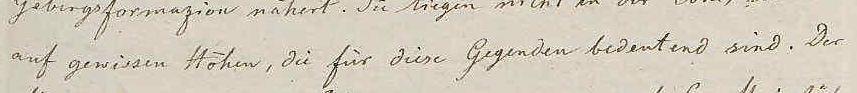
auf gewissen Höhen, die für diese Gegenden bedeutend sind. Der
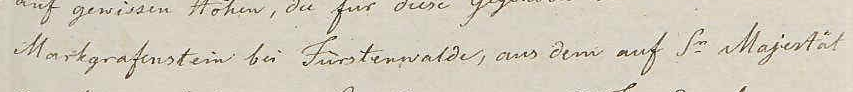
Markgrafenstein bei Fürstenwalde, aus dem auf Sr Majestät
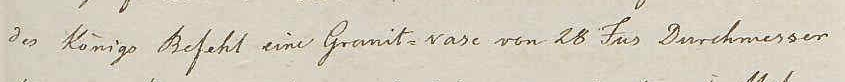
des Königs Befehl eine Granit-vase von 28 Fus Durchmesser
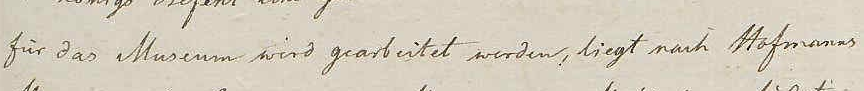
für das Museum wird gearbeitet werden, liegt nach Hofmanns
